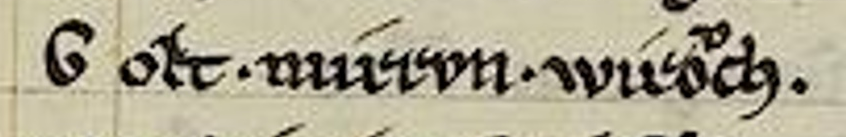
Golt. mirrvn. wiro°vch.
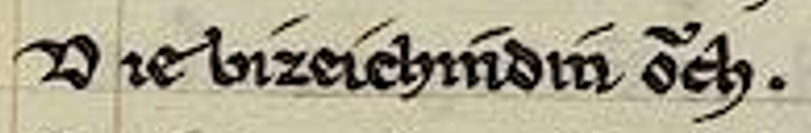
Die bizeichindin o°vch.
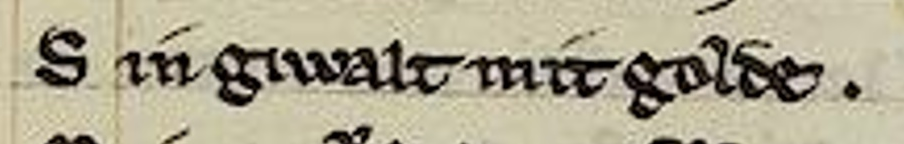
Sin giwalt mit golde.
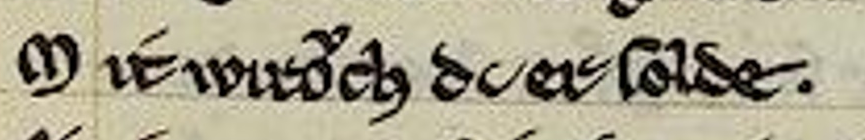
Mit wiro°vch d(az) er ſolde.
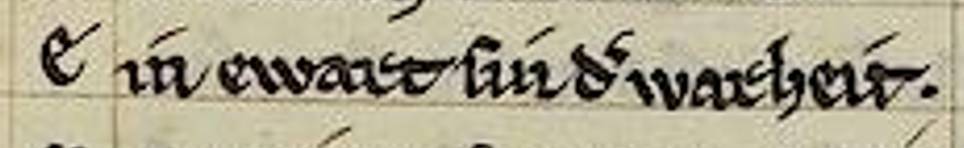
Ein ewart ſin d(er) warheit.
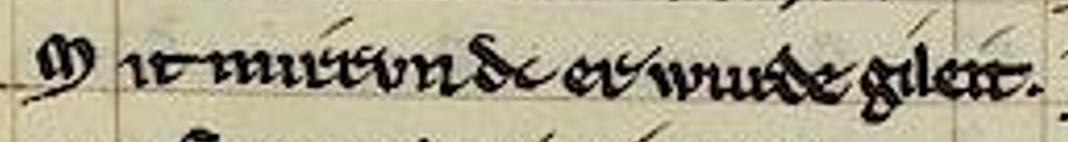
Mit mirrvn d(az) er wurde gileit.
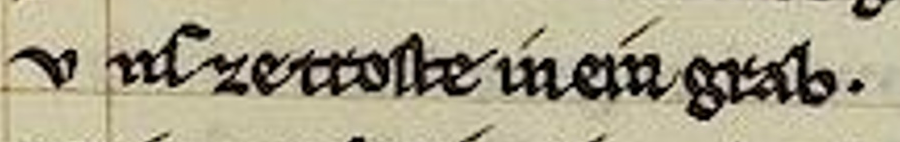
Vnſ zetroſte in ein grab.
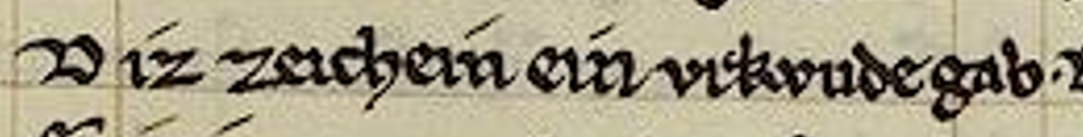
Diz zeichein ein vrkvnde gab.
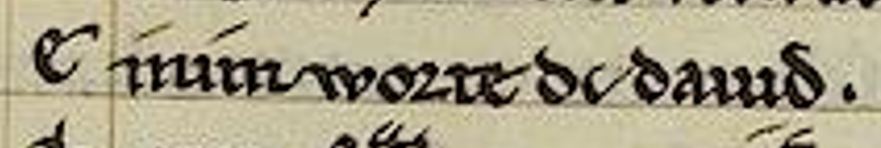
Einim worte d(az) dauid.
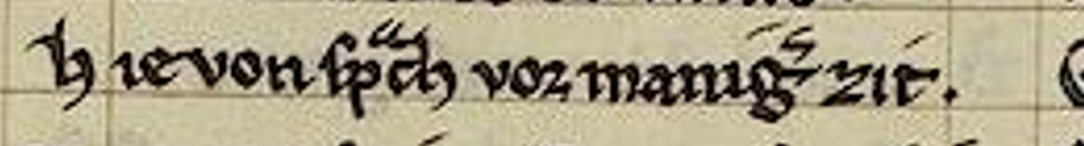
Hie von ſp(ra)ch vor manig(er) zit.
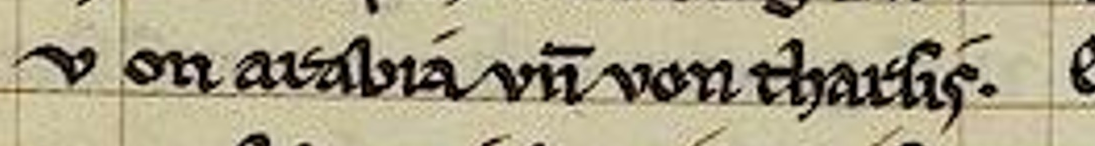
Von arabia vn(d) von tharſis.
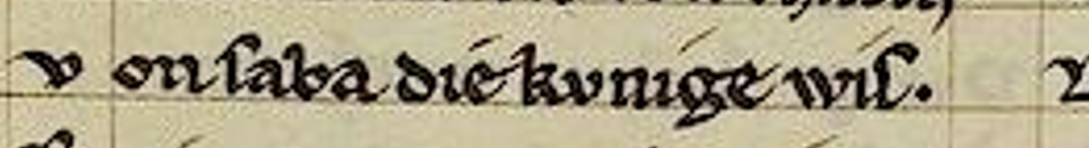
Von ſaba die kvnige wiſ.
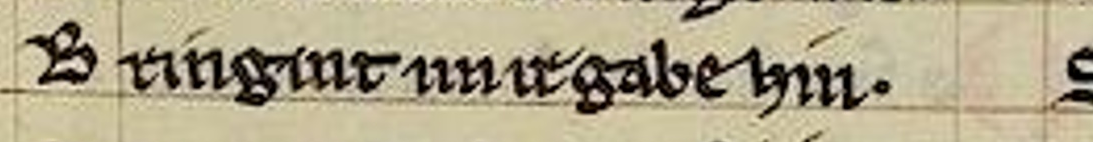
Bringint im ir gabe hin.
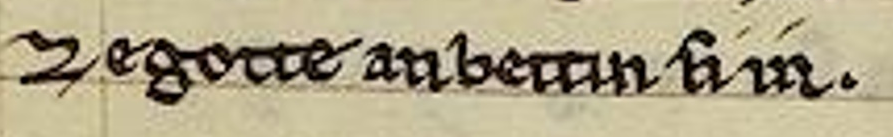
Ze gotte an bettin ſi in.
